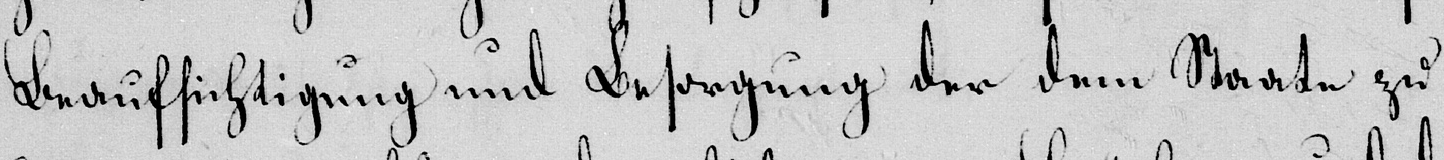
Beaufsichtigung und Besorgung der dem Staate zu
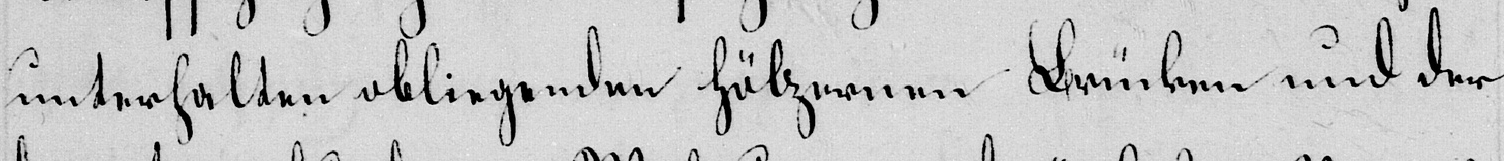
unterhalten obliegenden hölzernen Brücken und der
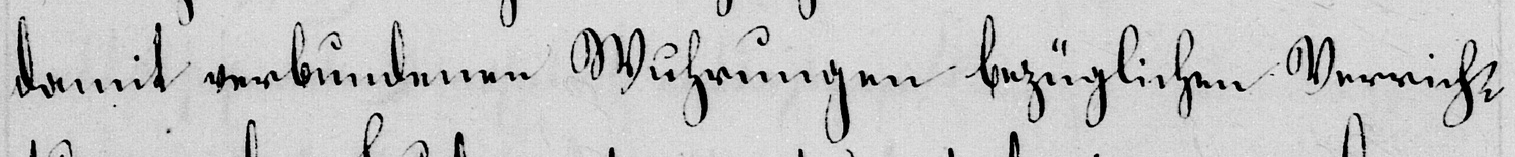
damit verbundenen Wuhrungen bezüglichen Verrich¬
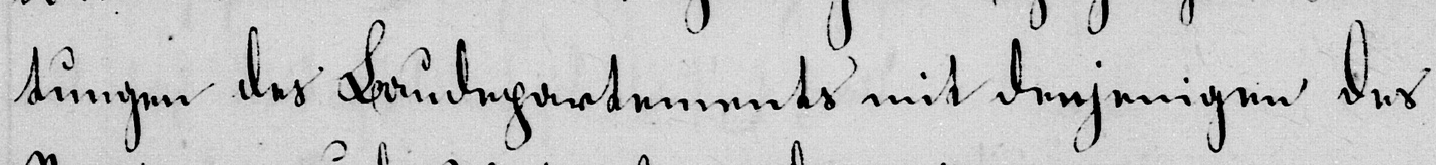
tungen des Baudepartements mit denjenigen des
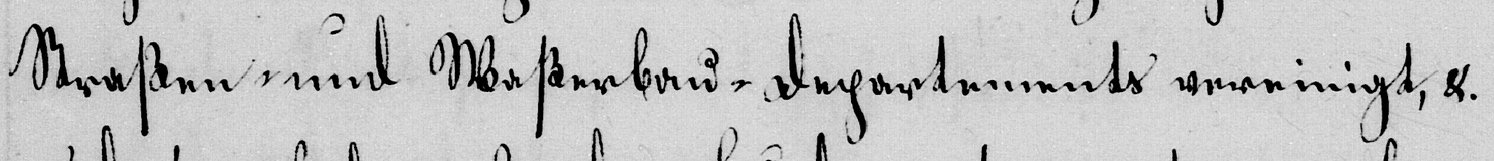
Straßen- und Waßerbau-Departements vereinigt, &.
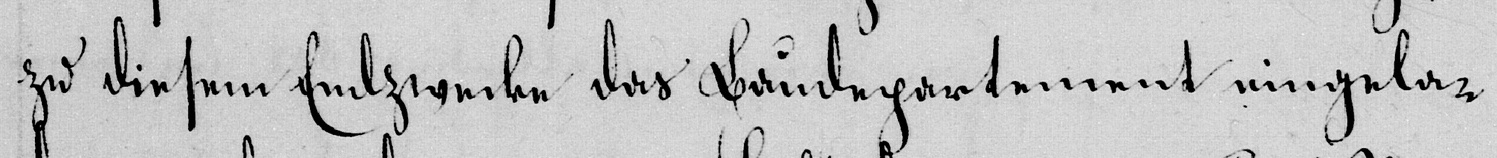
zu diesem Endzwecke das Baudepartement eingela¬
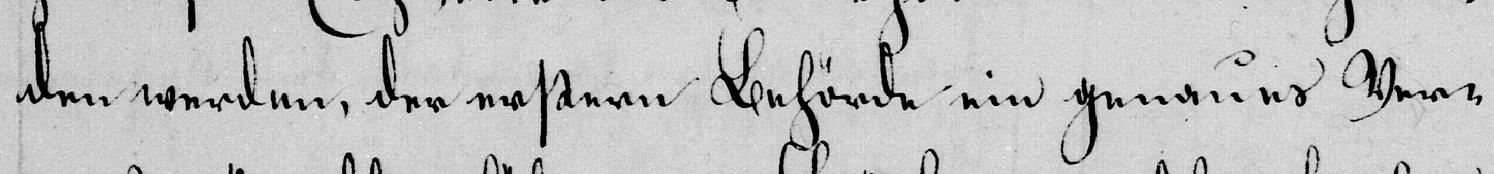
den werden, der erstern Behörde ein genaues Ver¬
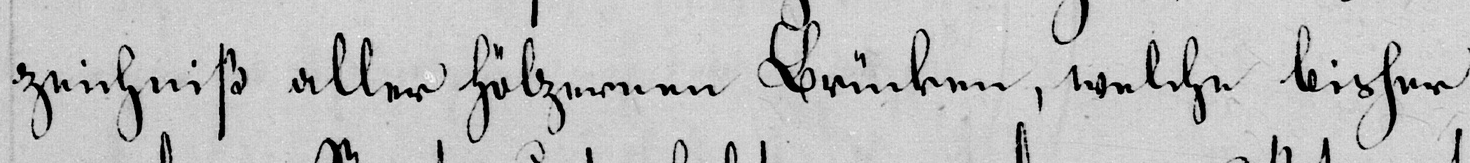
zeichniß aller hölzernen Brücken, welche bisher
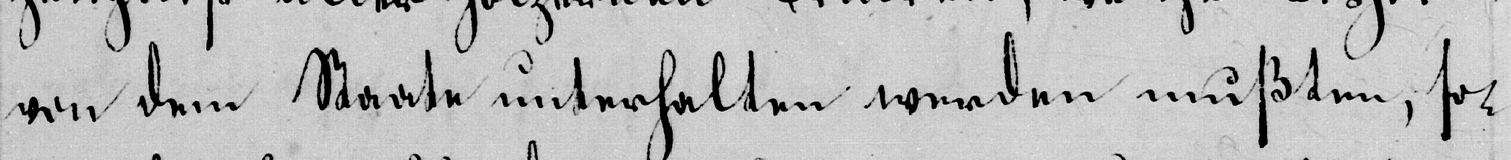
von dem Staate unterhalten werden mußten, so¬
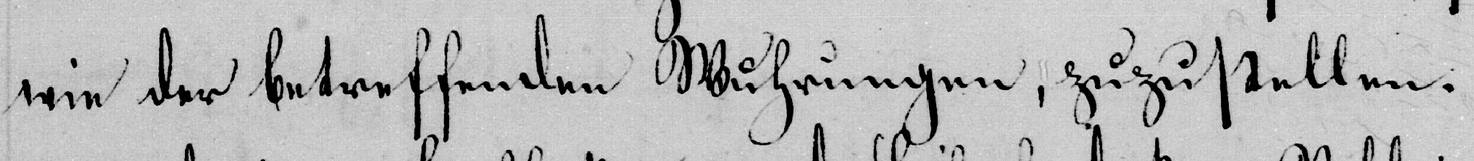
wie der betreffenden Wuhrungen, zuzustellen.
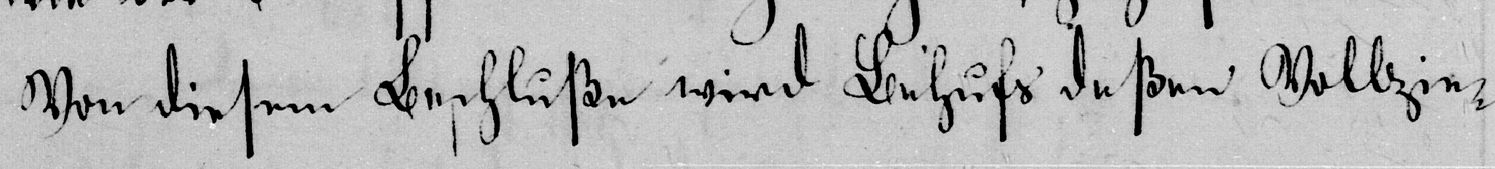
Von diesem Beschluße wird Behufs deßen Vollzie-
